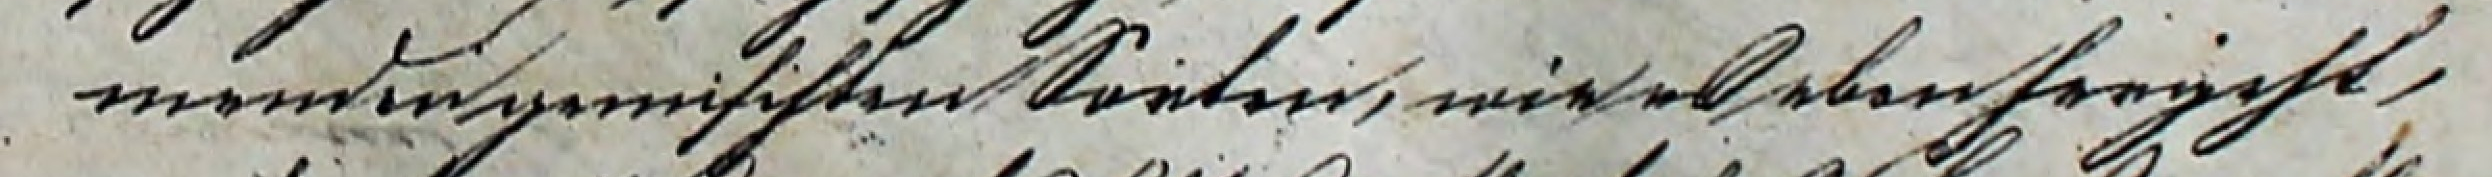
menden gemischten Sorten, wie es eben freizcht,
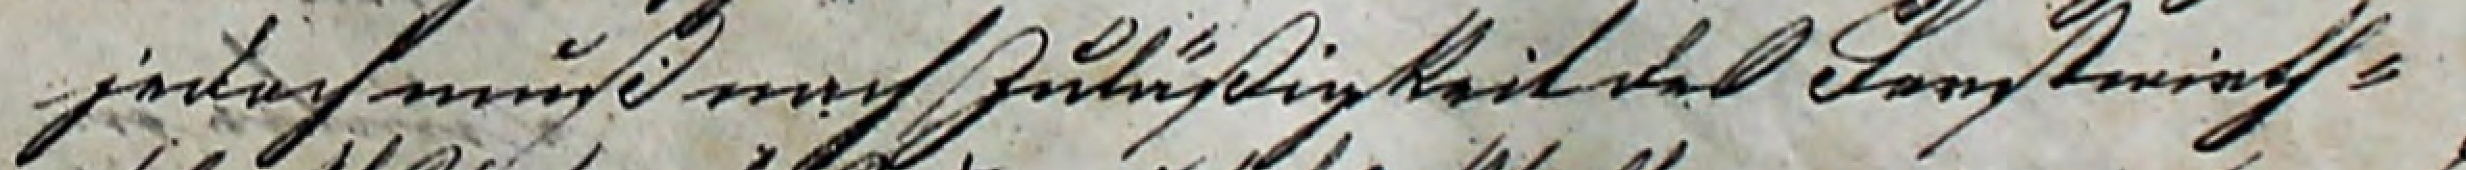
jedach muß nach Zuläßigkeit des Sorstwirth=
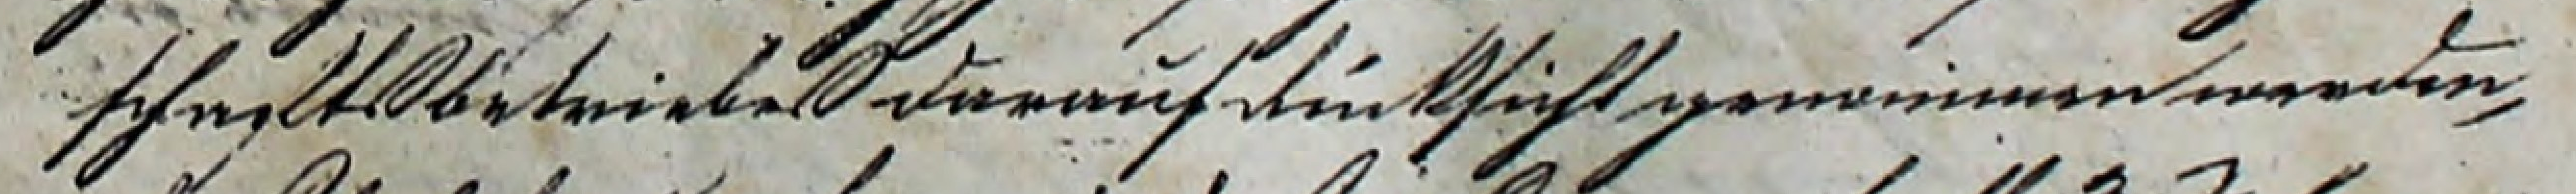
schaftsbetriebes darauf drücksicht gerwinnen werden,
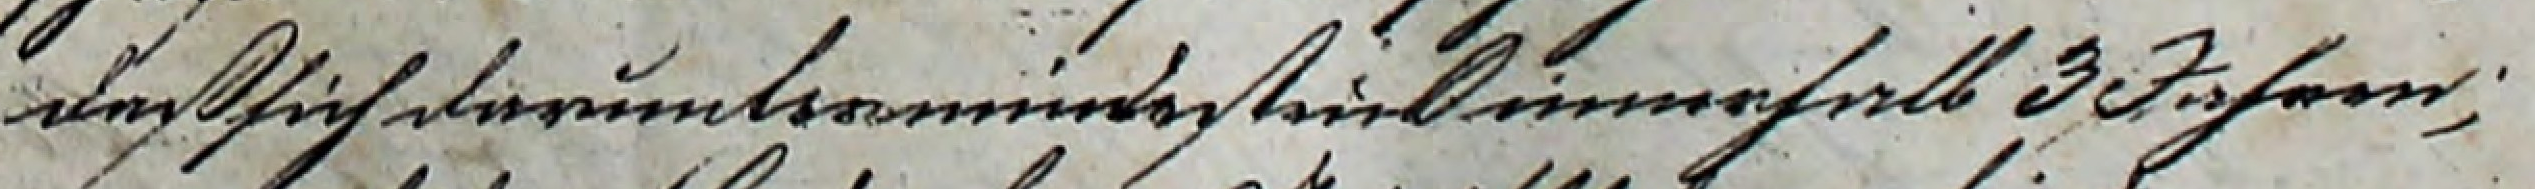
daßlich darumtremindesteies innehalb 3 Jahern;
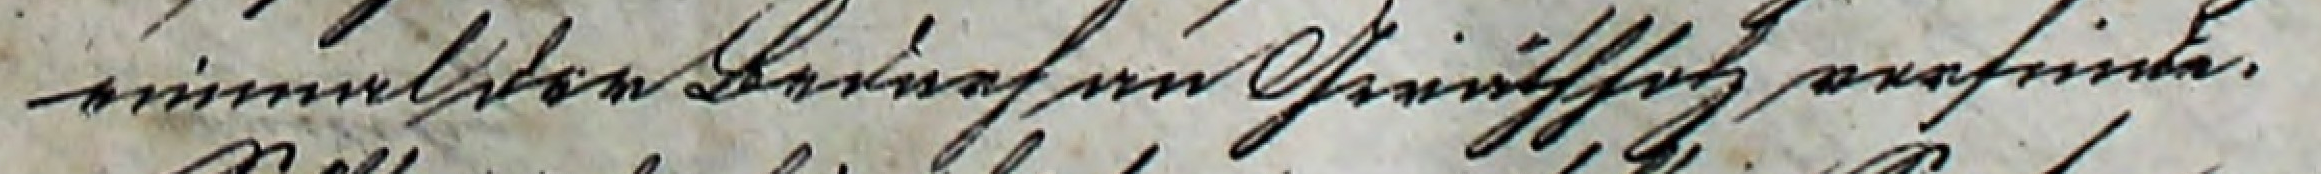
einmal der bedarf an Geräthholz verfeinde.
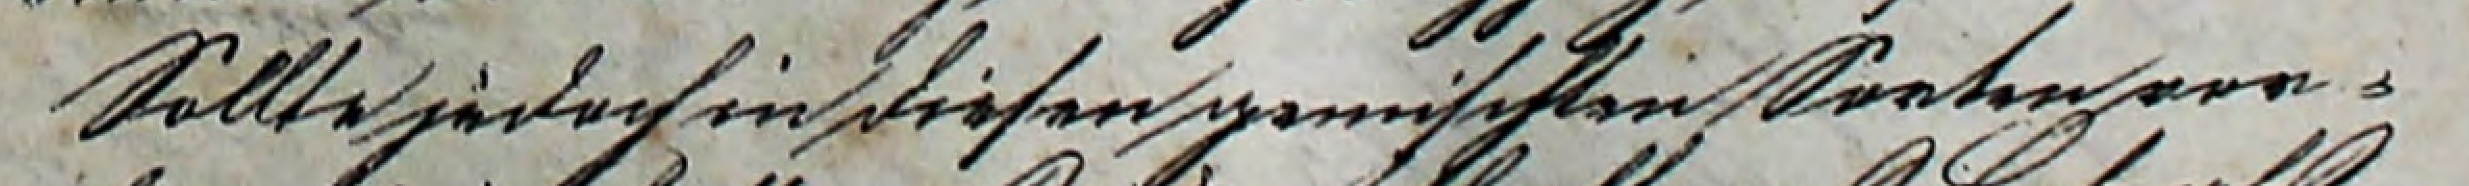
Sollte jedach in diesen gemischten Sorten ern=
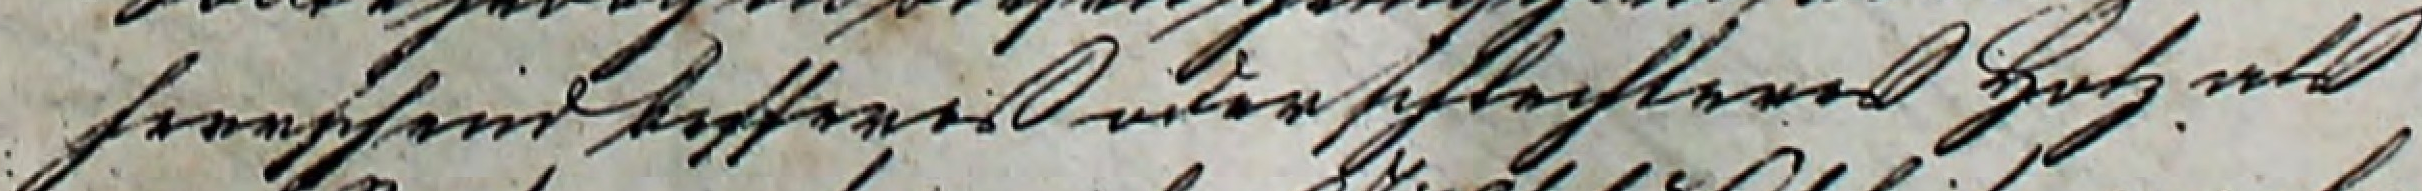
herrscheid kefferes oder schlechteres Holz als
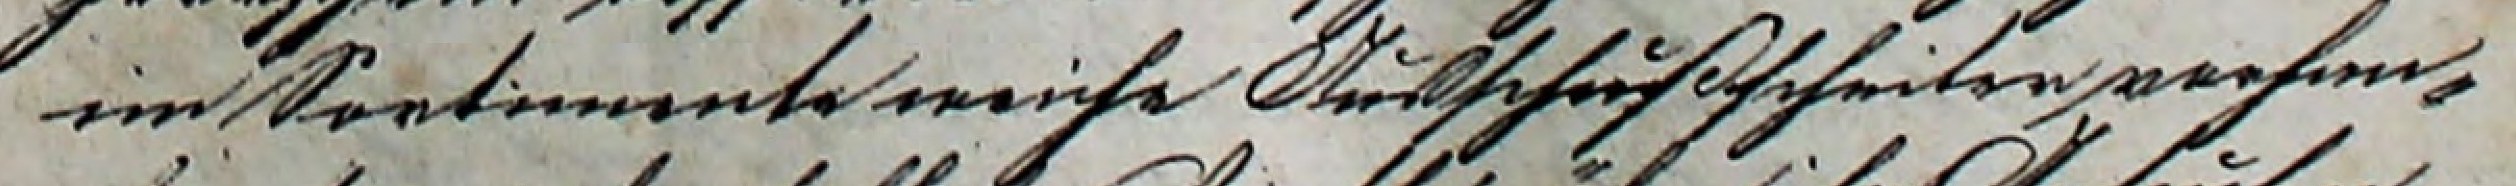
im Sortimente weiche Ausschußscheiter verhan„
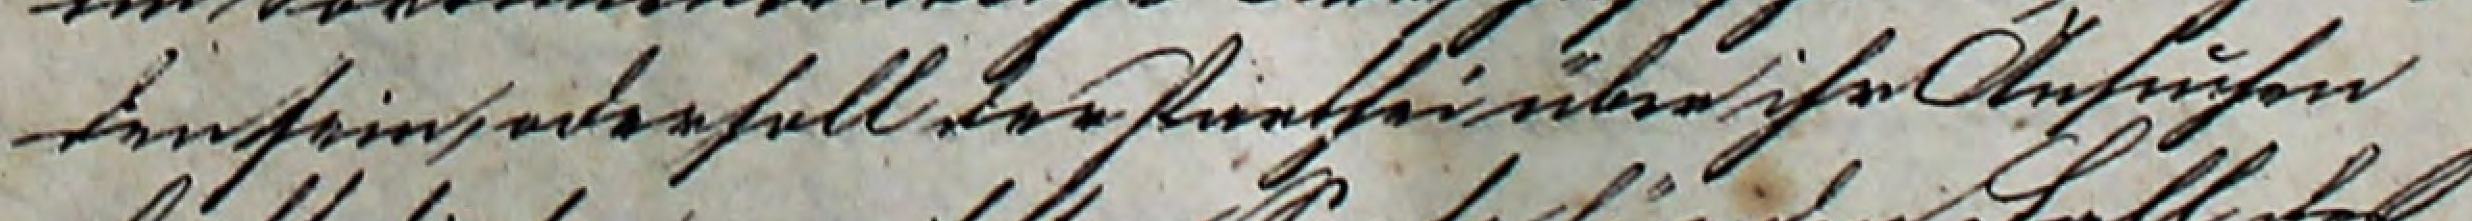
den sein, oder fall der Parthei über ihr Ansuchen
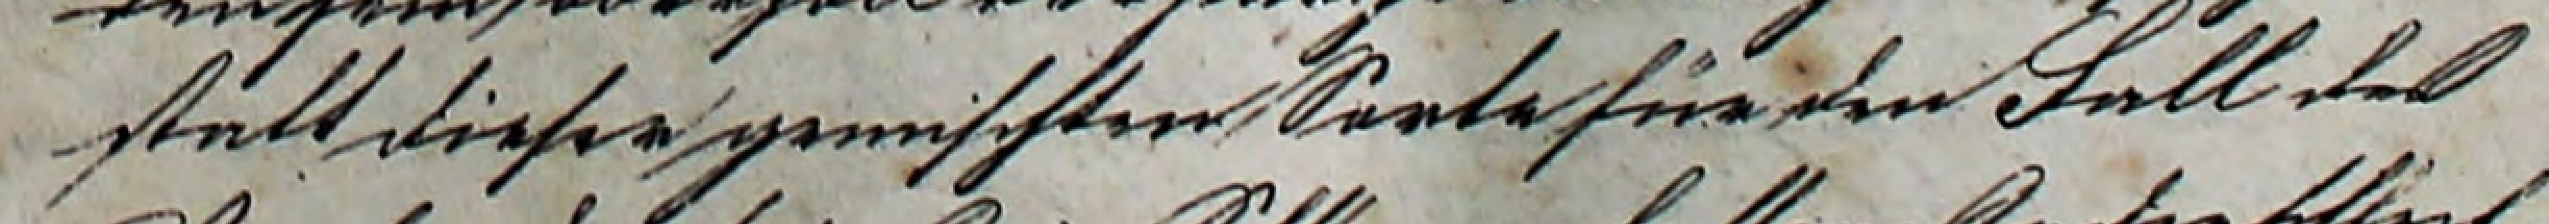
statt dieser gemischten Sorte für den Fall des
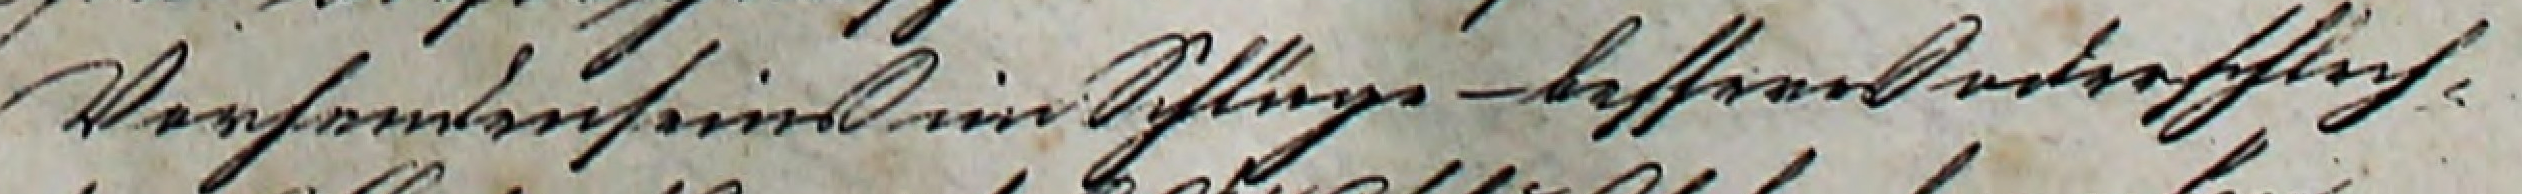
Verhandenseins im Schlags - besseres oder schlech„
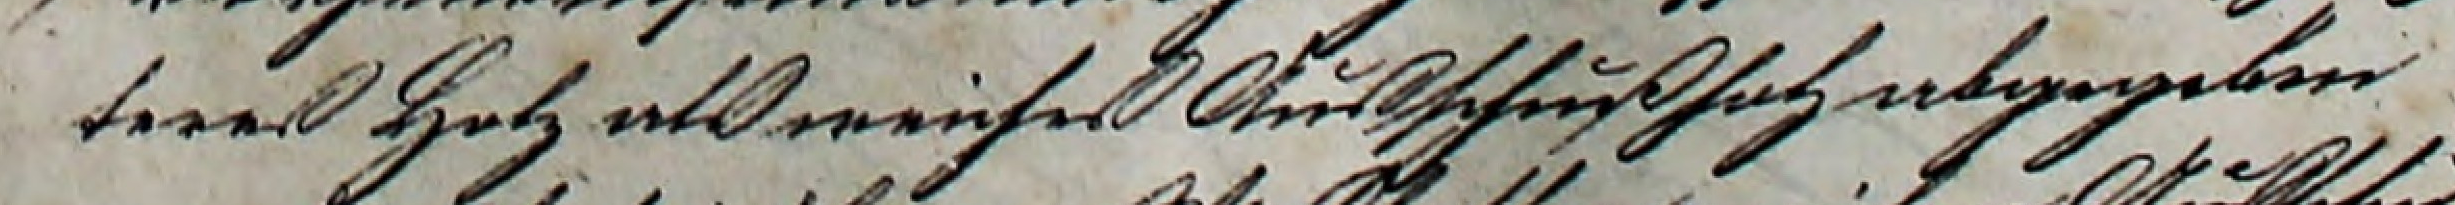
teres Holz als weiches Ausschußholz abgegeben
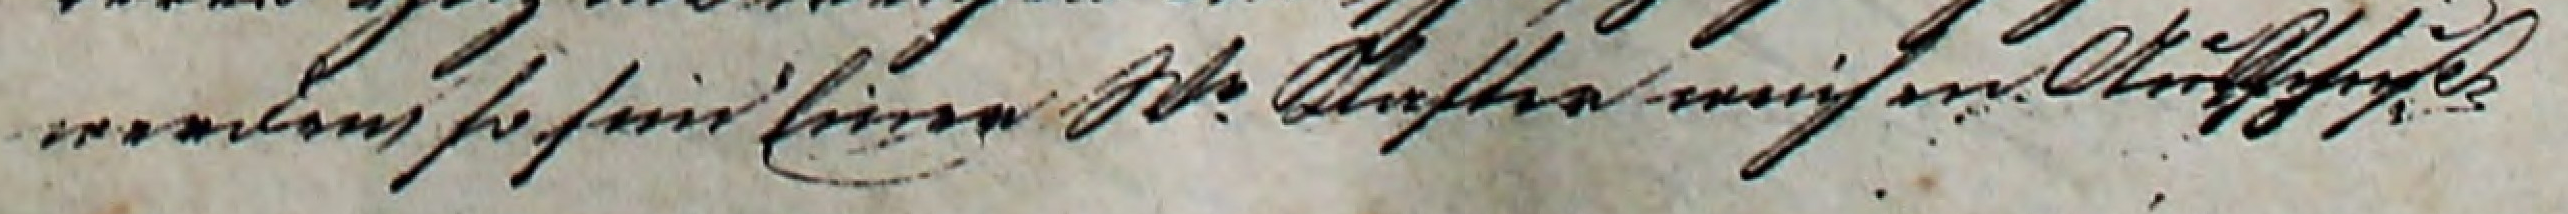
werden so sein Einer W? Klaster weichen Ausschuß„
